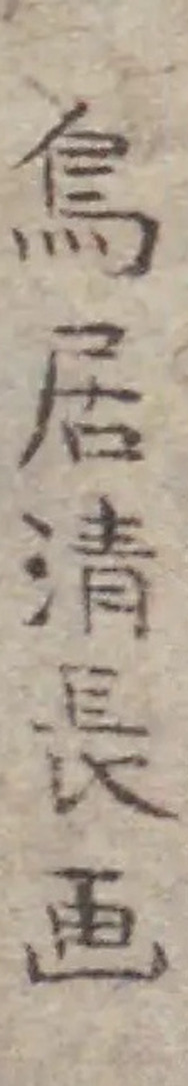鳥居清長画

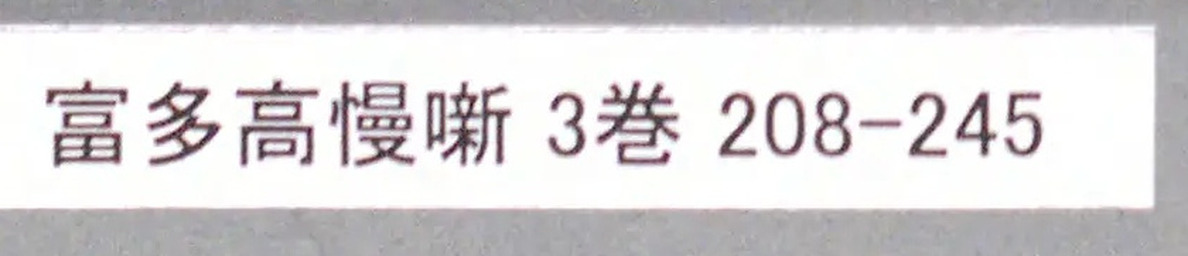冨多高慢噺上

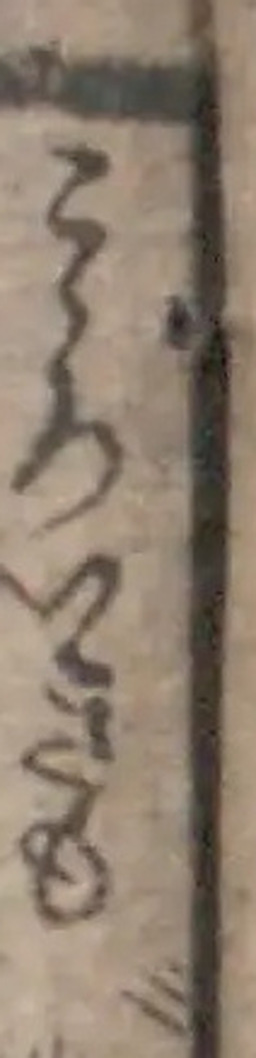こゝろいきも
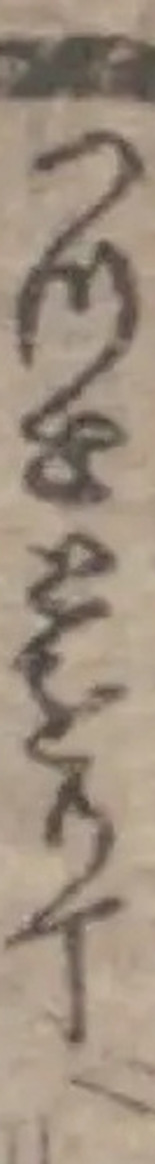つつをとをり丁
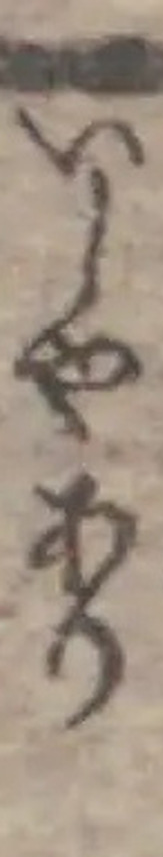いしやあり
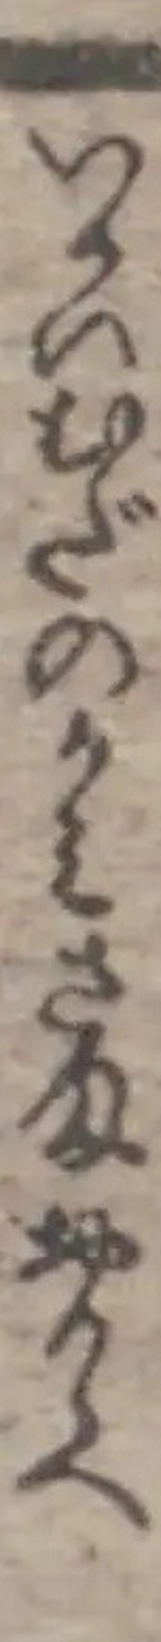いかいむだのかみさまおかゝへ
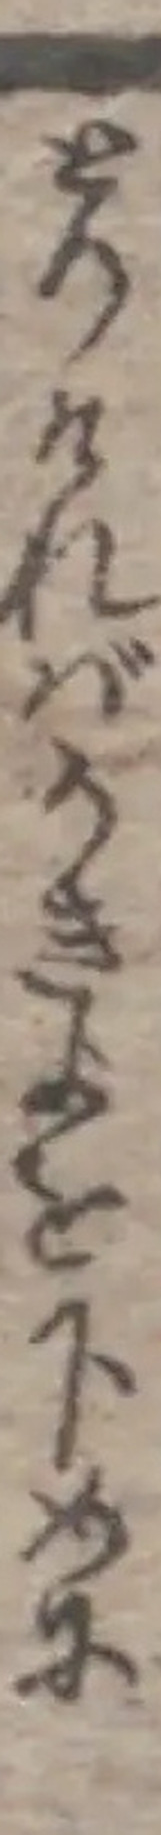とりければうきよを下めに
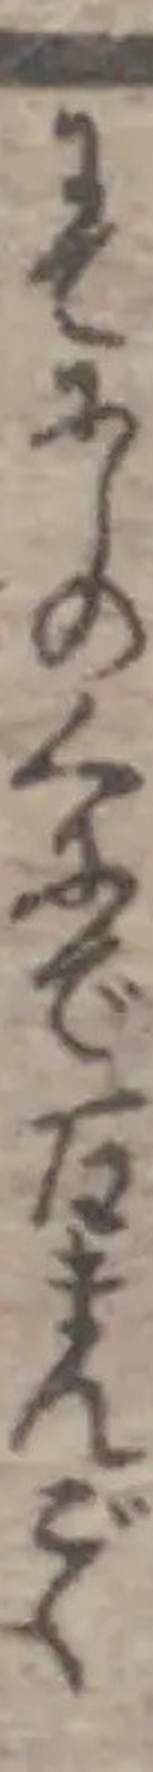にてにしのくにで百まんごく
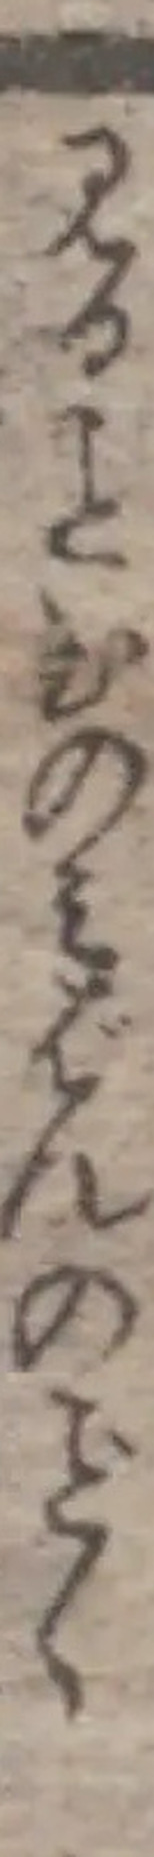見ることひのみばんのごとく
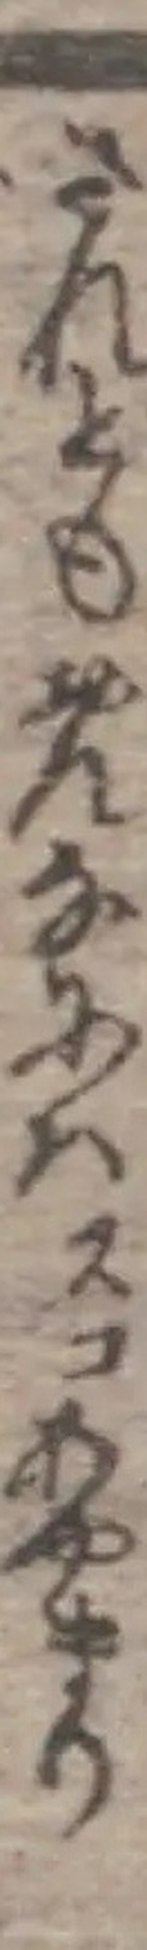されどもおんなにはスコあやまり
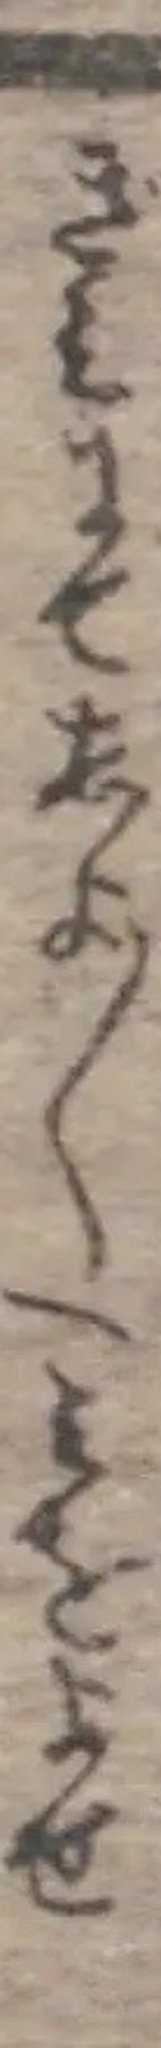ぎみにてしよ〳〵へみをよせ
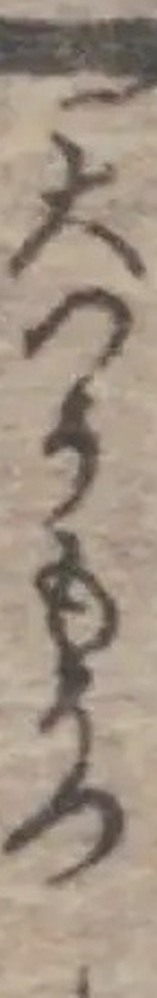〽大つうもうつ
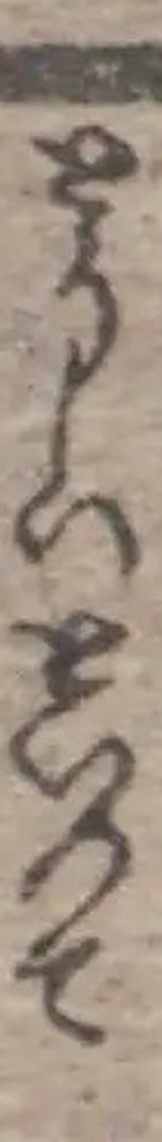とうしいといつて
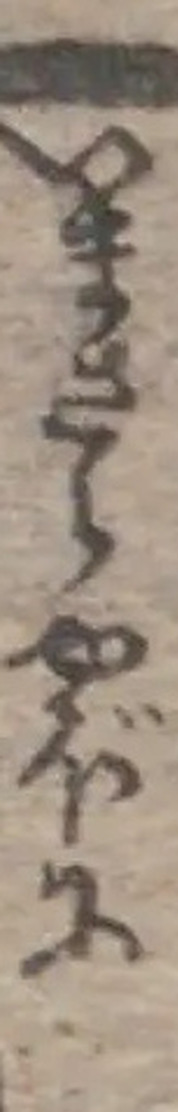いまさらやぼに
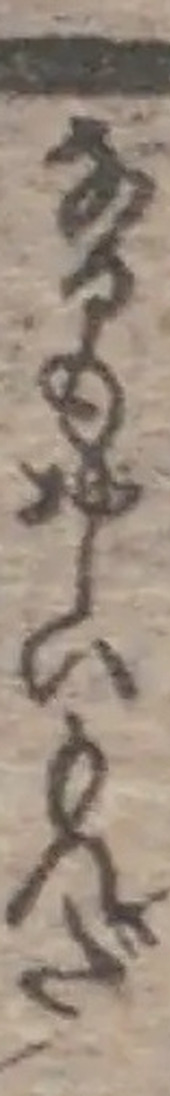なるもおしいもんだ
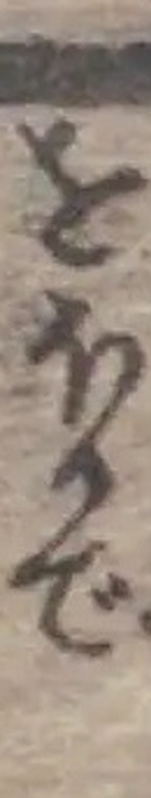をほかで
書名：富多高慢噺 3巻
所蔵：国立国会図書館 National Diet Library, JAPAN
